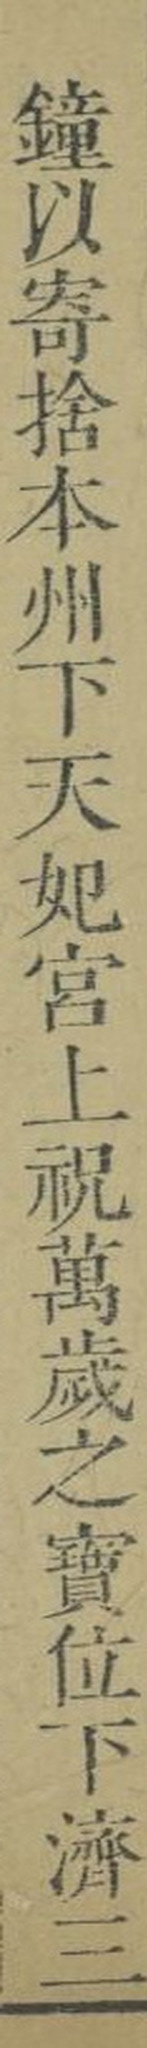鐘以寄捨本州下天妃宮上祝萬歲之寶位下濟三
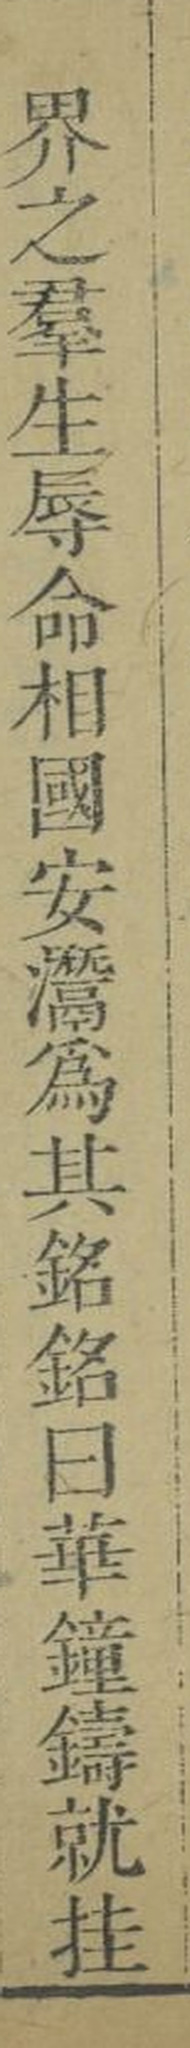界之羣生辱命相國安灊爲其銘銘曰華鐘鑄就挂
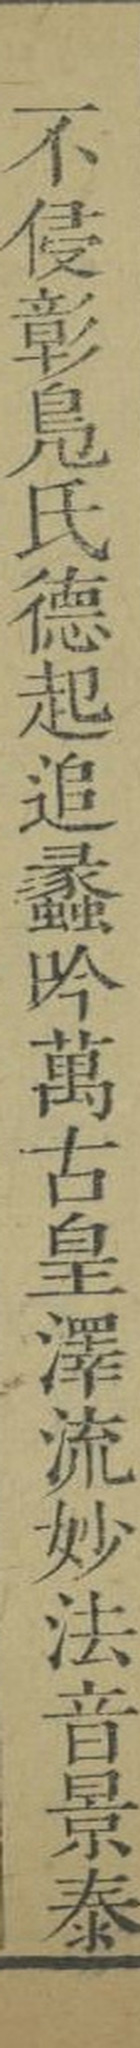不侵彰鳬氏德起追蠡吟萬古皇澤流妙法音景泰
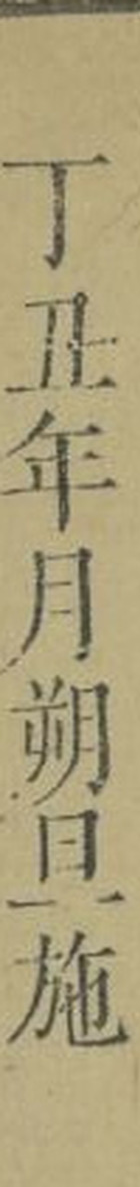丁丑年月朔旦施
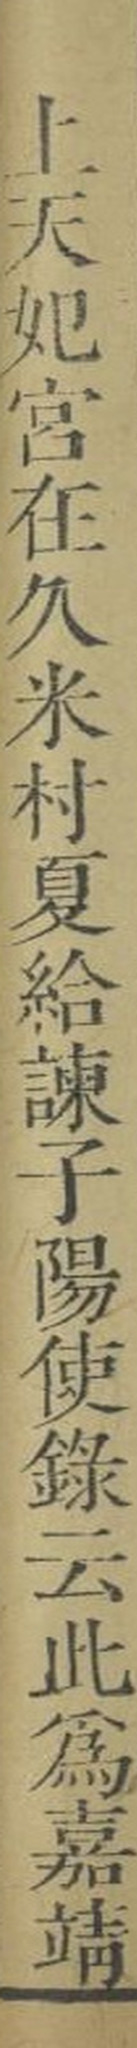上天妃宮在久米村夏給諫子陽使錄云此爲嘉靖
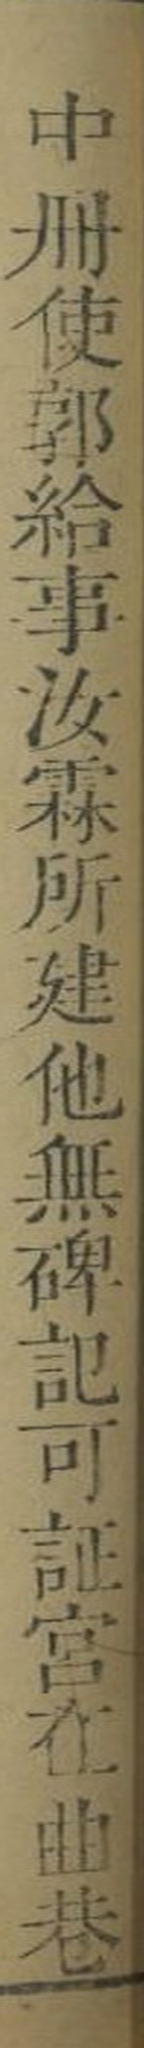中冊使郭給事汝霖所建他無碑記可証宮在曲巷
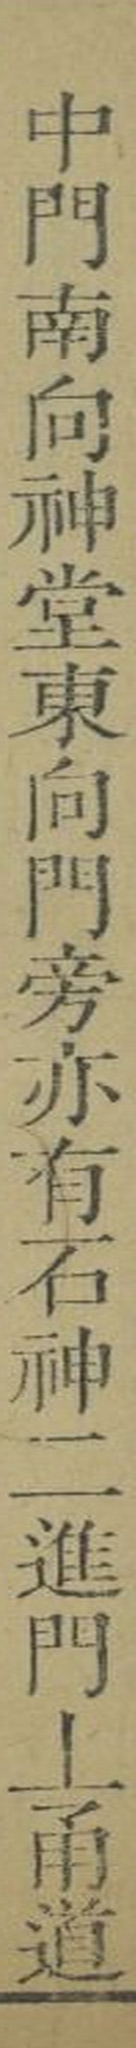中門南向神堂東向門旁亦有石神二進門上甬道
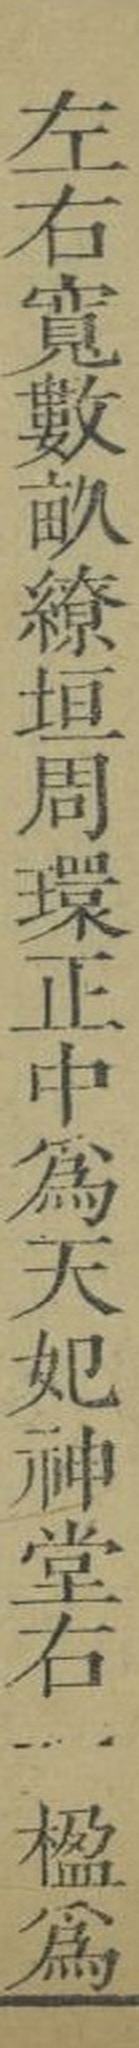左右寬數畝繚垣周環正中爲天妃神堂右一楹爲
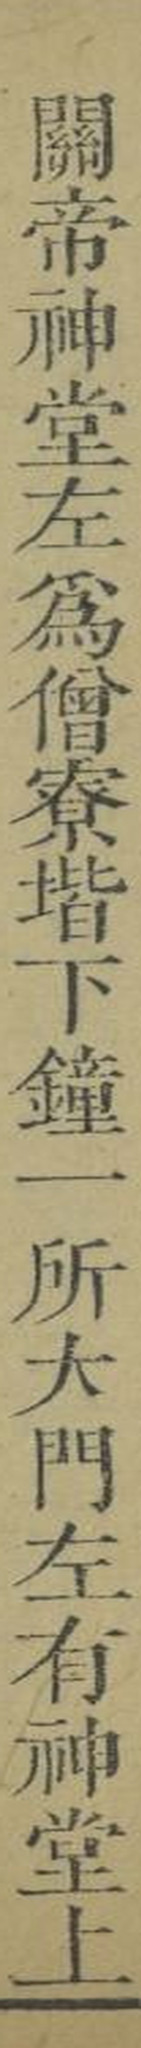關帝神堂左爲僧寮堦下鐘一所大門左有神堂上
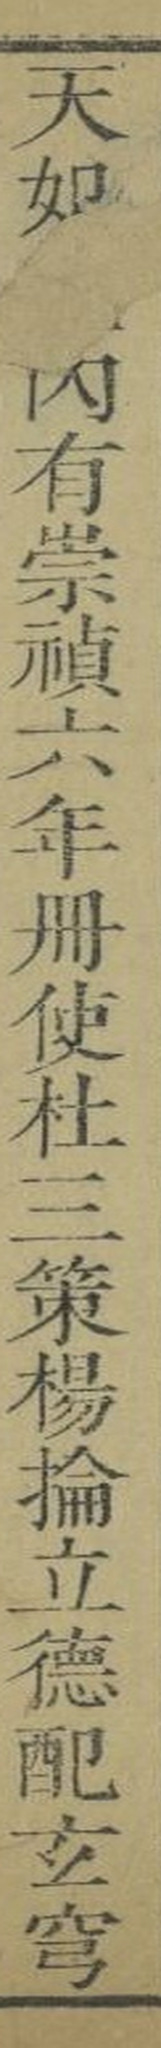天妃堂内有崇禎六年冊使杜三策楊掄立德配玄穹
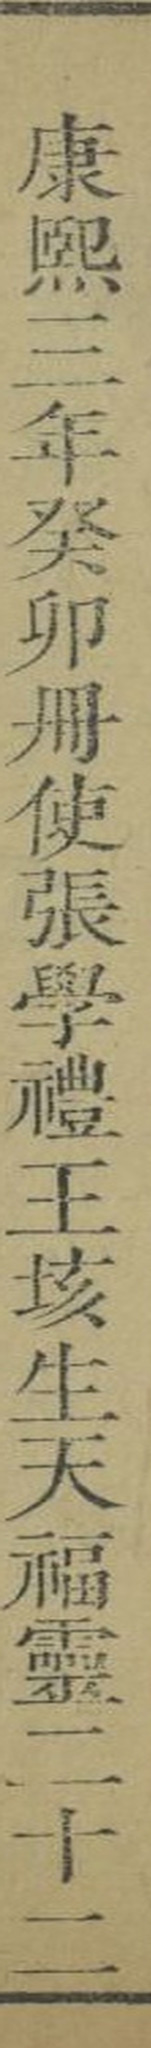康煕三年癸卯冊使張學禮王垓生天福靈二十二
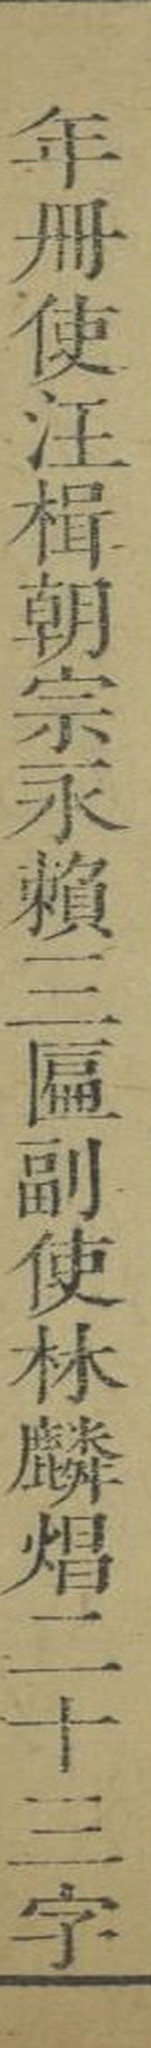年冊使汪楫朝宗永賴三匾副使林麟焻二十三字
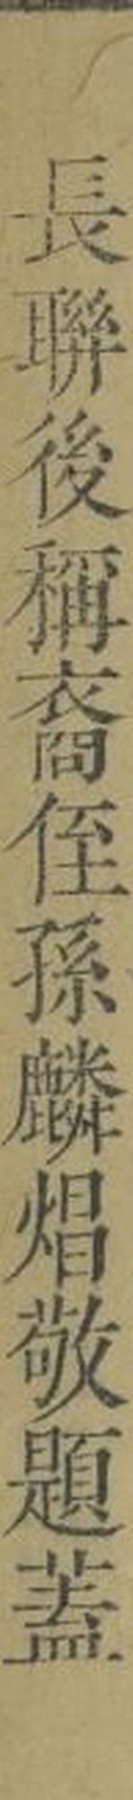長聯後稱裔侄孫麟焻敬題蓋

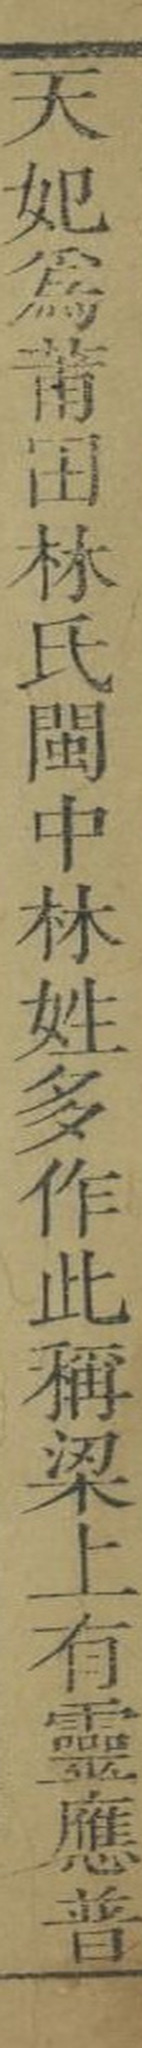天妃爲莆田林氏閩中林姓多作此稱梁上有靈應普
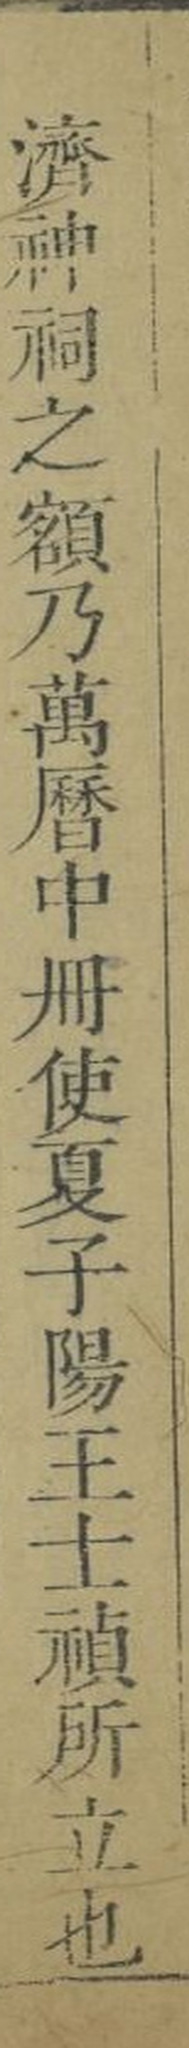濟神祠之額乃萬曆中冊使夏子陽王士禎所立也
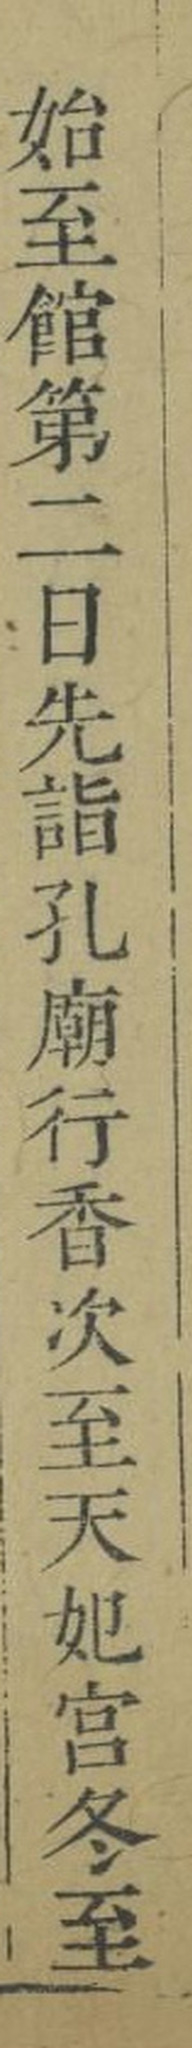始至館第二日先詣孔廟行香次至天妃宫冬至
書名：中山伝信録 巻二
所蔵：University of the Ryukyus Library
